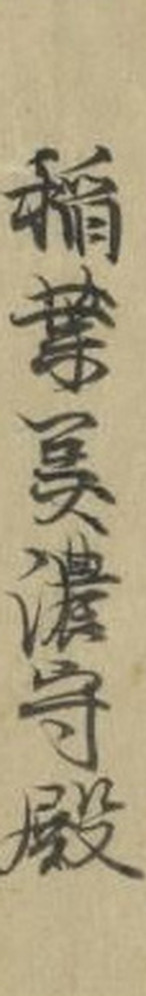謹上稲葉美濃守殿
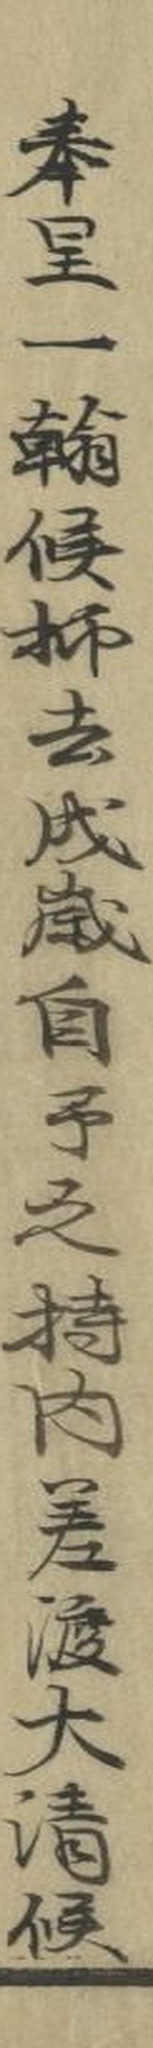奉呈一翰候抑去戌歳自予之持内差渡大清候
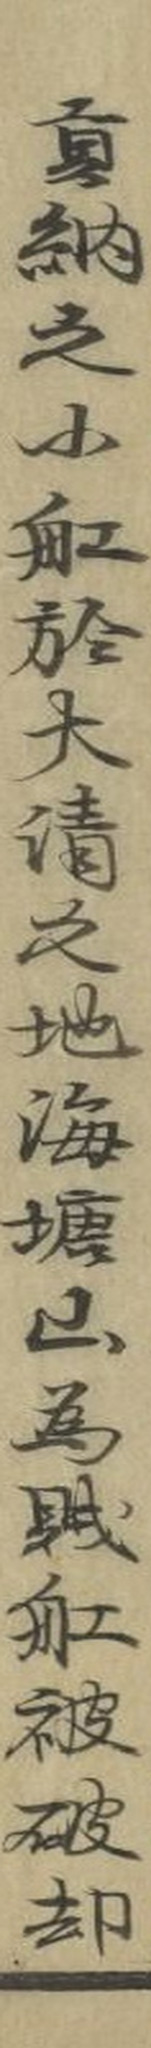貢納之小舩於大清之地海塘山為賊舩被破却
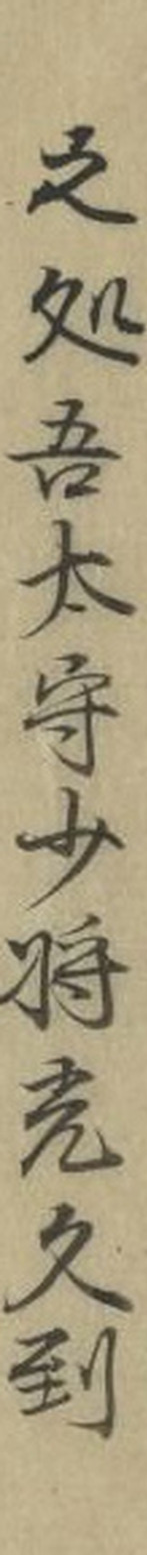之処吾太守少将光久到
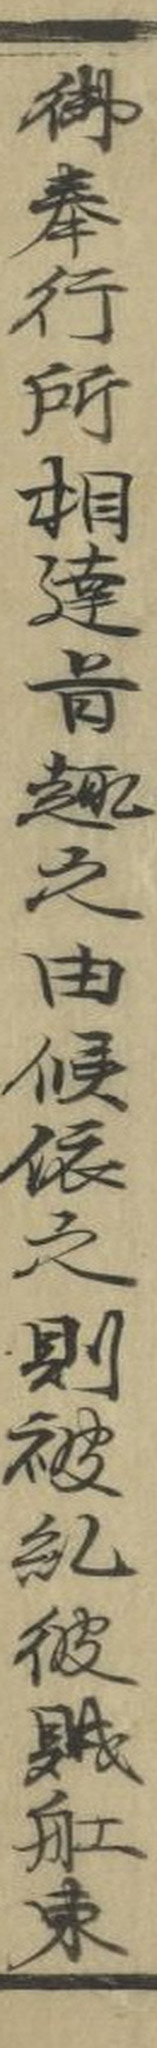御奉行所相達旨趣之由候依之則被糺彼賊舩東
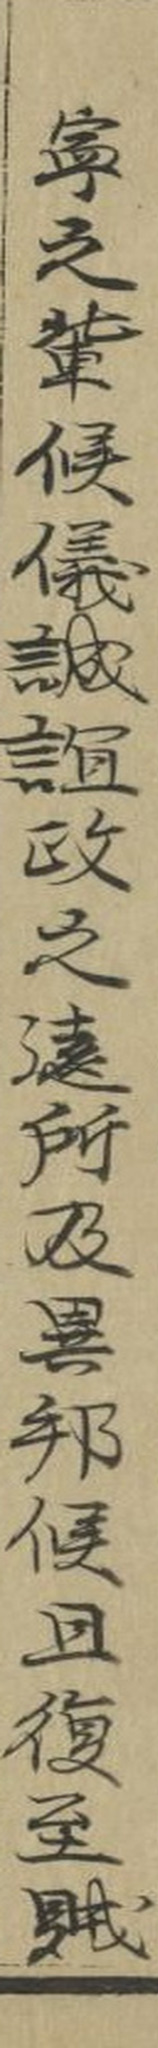寧之輩候儀誠誼政之遠所及異邦候且復至賊
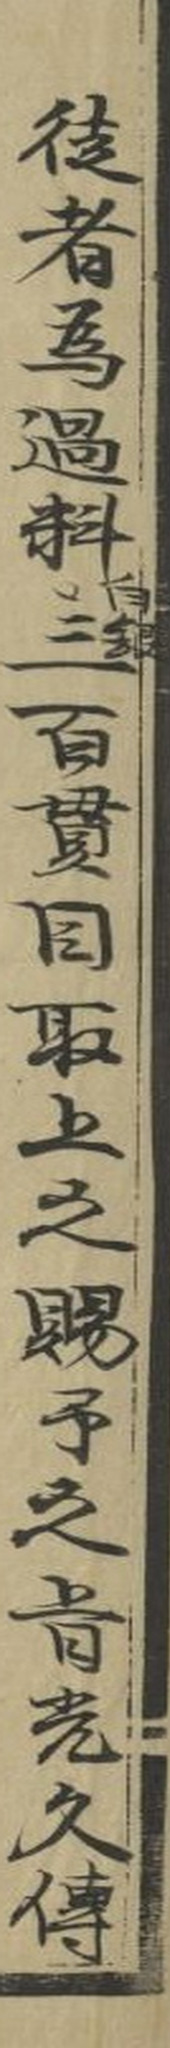従者為過料白銀三百貫目取上之賜予旨光久伝
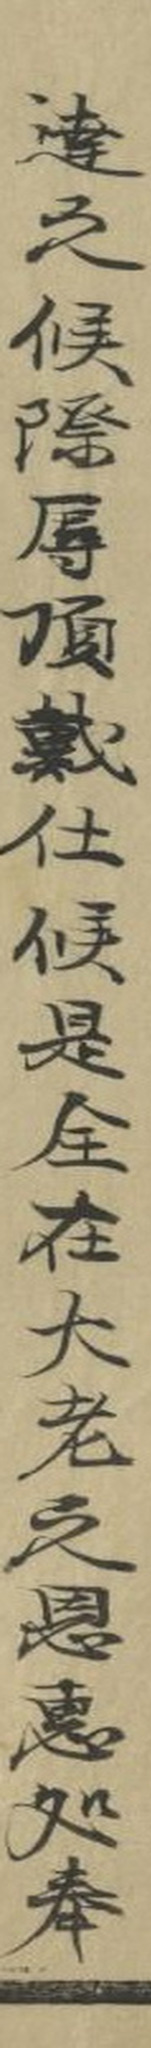達之候際辱頂戴仕候是全在大老之恩恵処奉
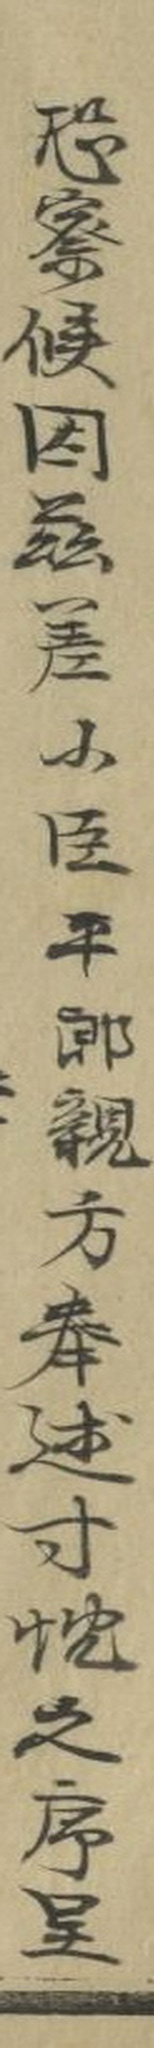恐察候因茲差小臣平郎親方奉述寸忱之序呈
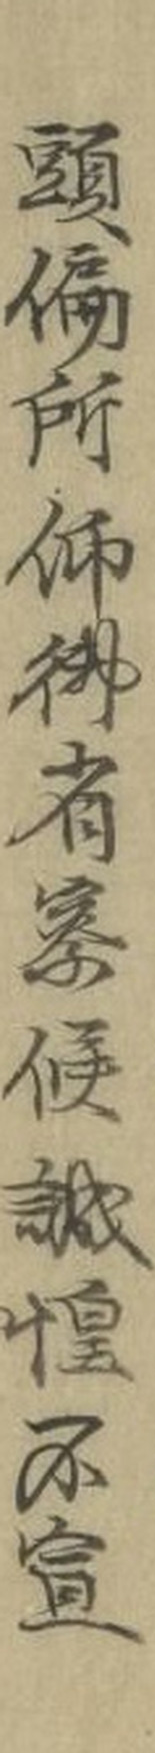頭偏所仰御省察候誠惶不宣
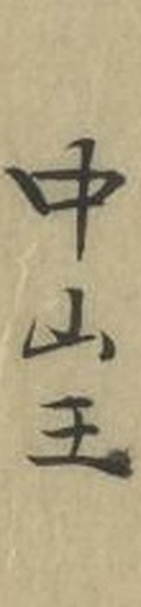中山王
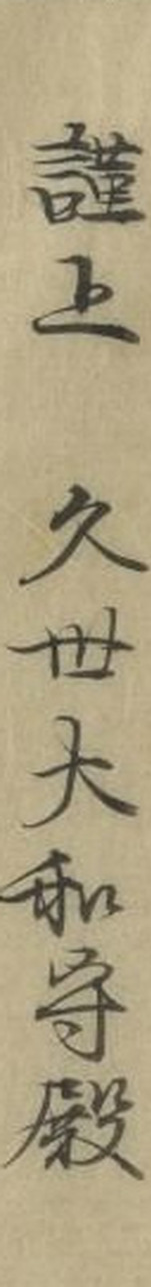謹上久世大和守殿

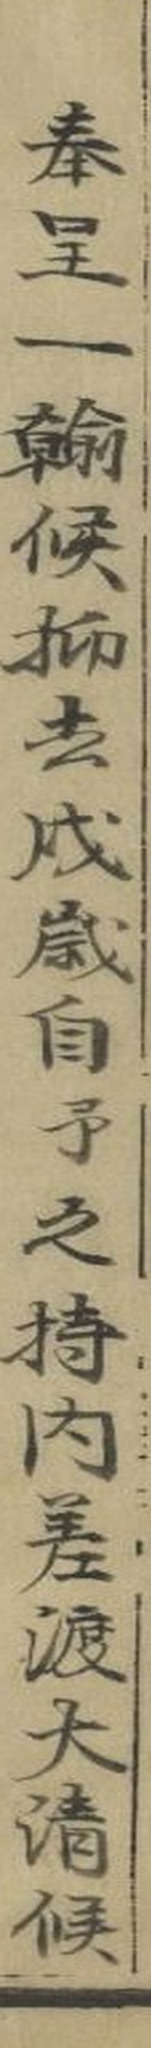奉呈一翰候抑去戌歳自予之持内差渡大清候
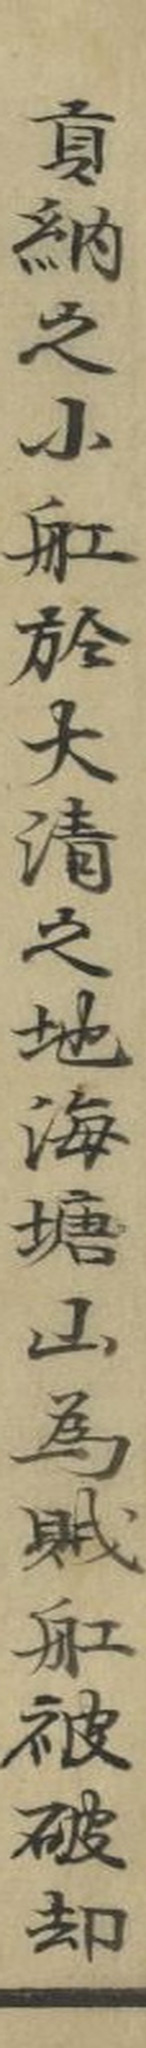貢税之小舩於大清之地海塘山為賊舩被破却
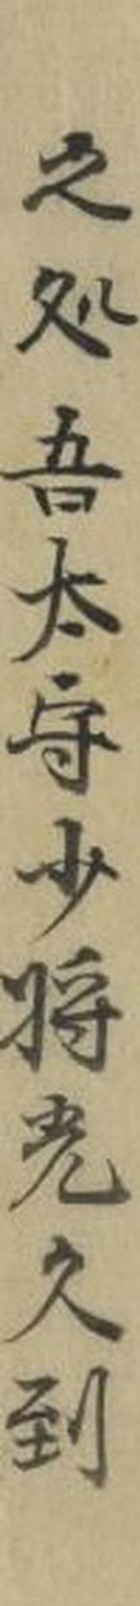之処吾太守少将光久到
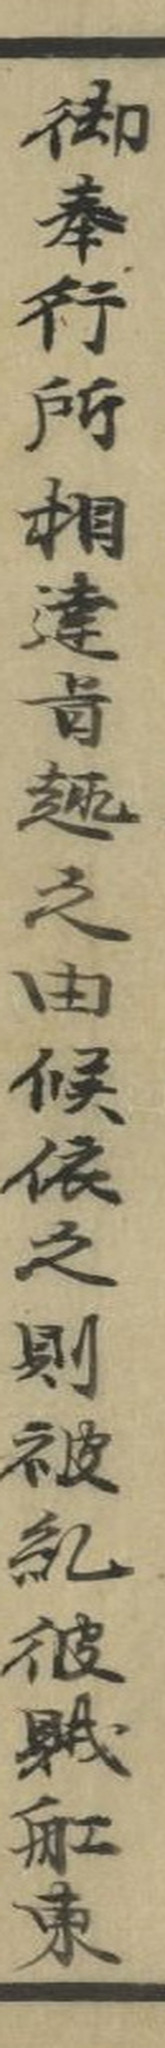御奉行所相達旨趣之由候依之則被糺彼賊舩東
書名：琉球往来（下）
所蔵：University of the Ryukyus Library
